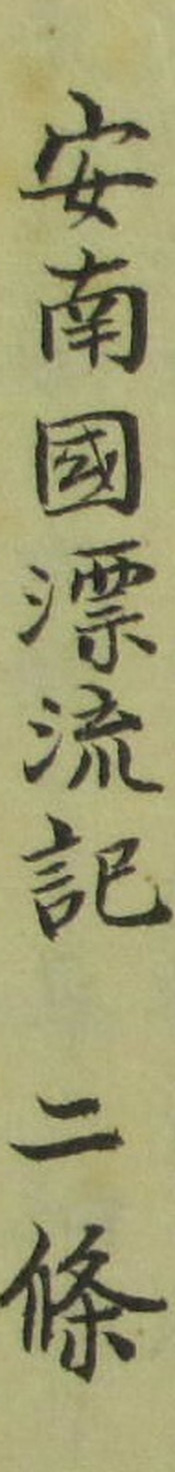安南國漂流記二條
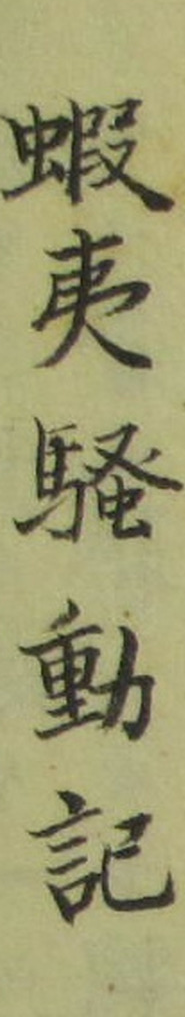蝦夷騒動記

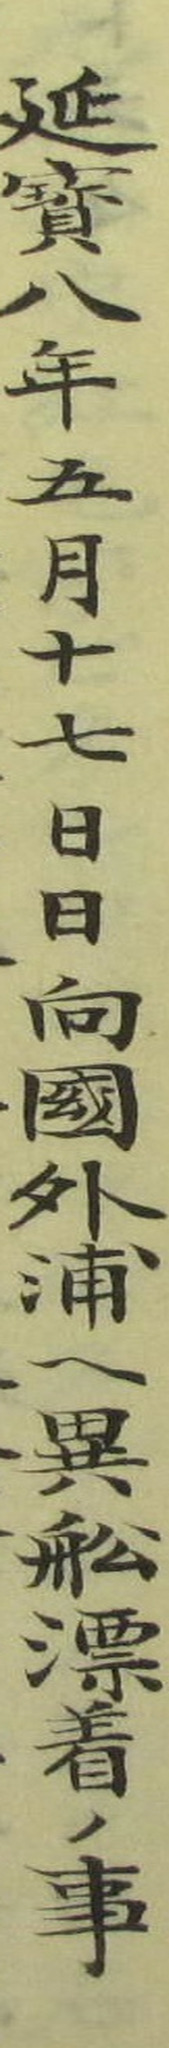延寶八年五月十七日日向國外浦ヘ異舩漂着ノ事
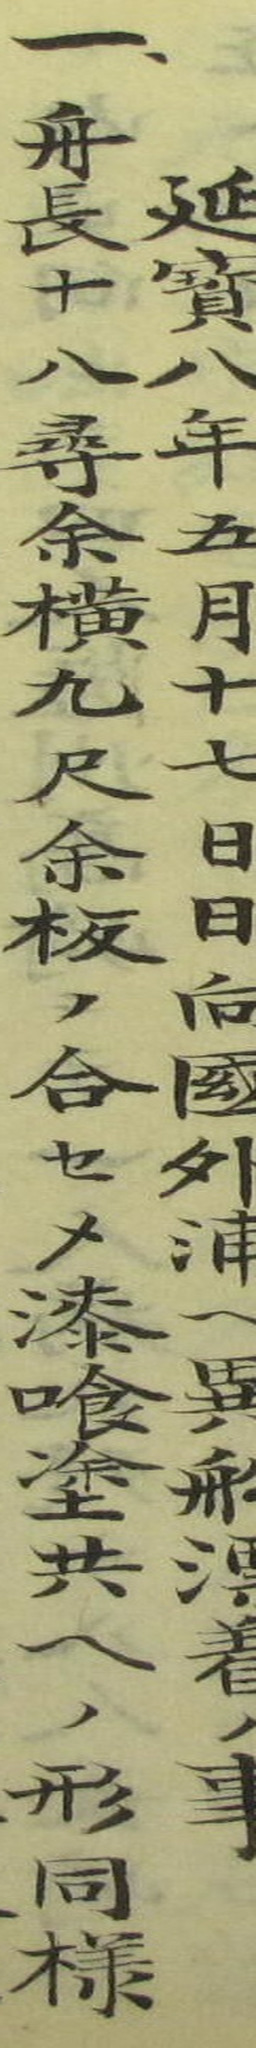一舟長十八尋余横九尺余板ノ合セメ漆喰塗共ヘノ形同様
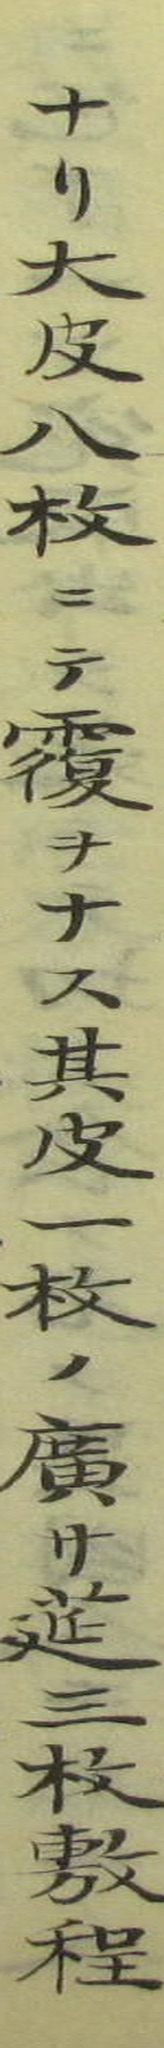ナリ大皮八枚ニテ覆ヲナス其皮一枚ノ廣サ筵三枚敷程
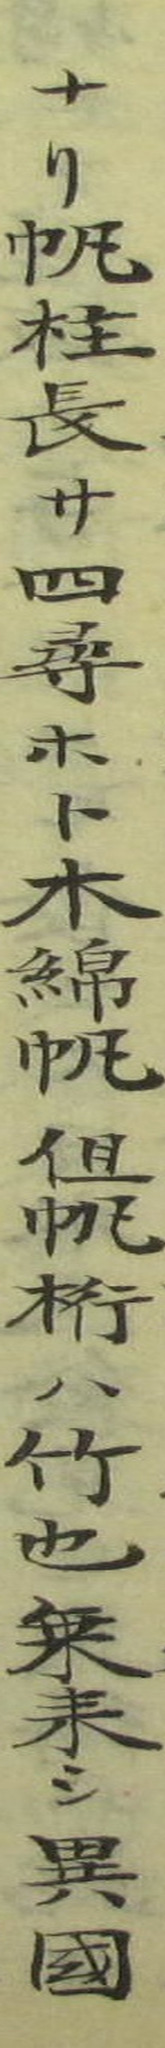ナリ帆柱長サ四尋ホト木綿帆但帆桁ハ竹也乗来シ異國
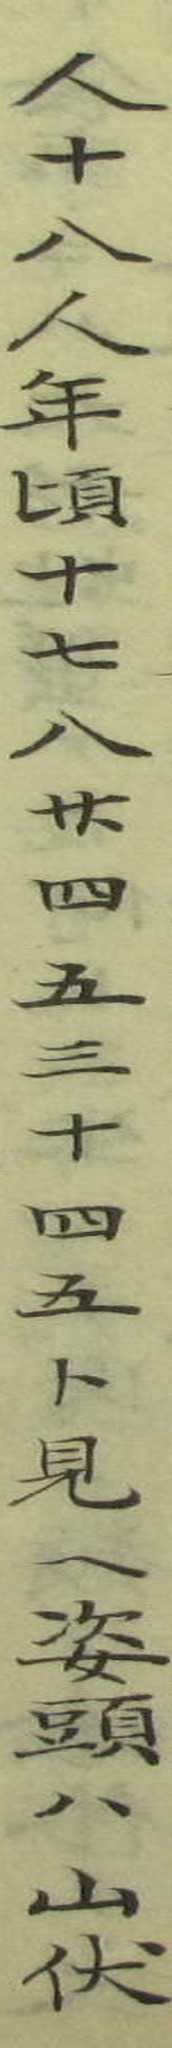人十八人年頃十七八廿四五三十四五ト見ヘ姿頭ハ山伏
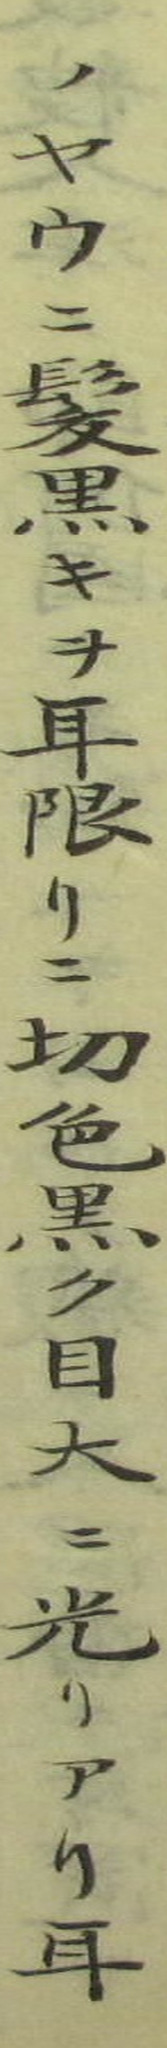ノヤウニ髪黒キヲ耳限リニ切色黒ク目大ニ光リアリ耳
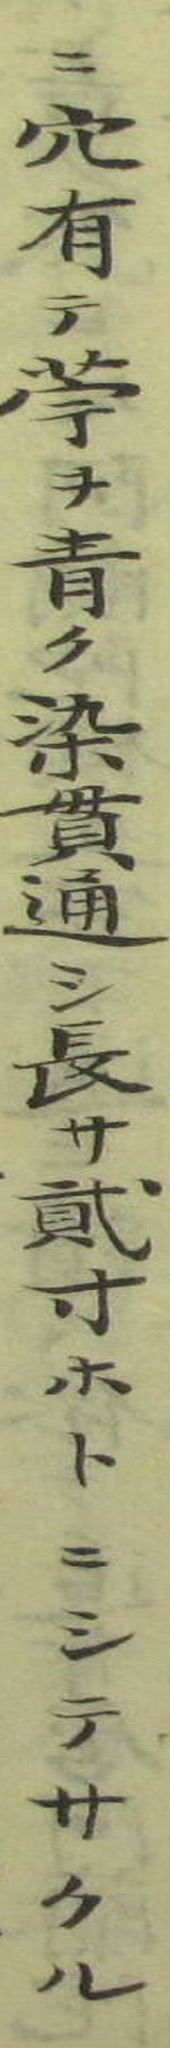に穴有テ苧ヲ青ク染貫通シ長サ貳寸ホトニシテサクㇽ
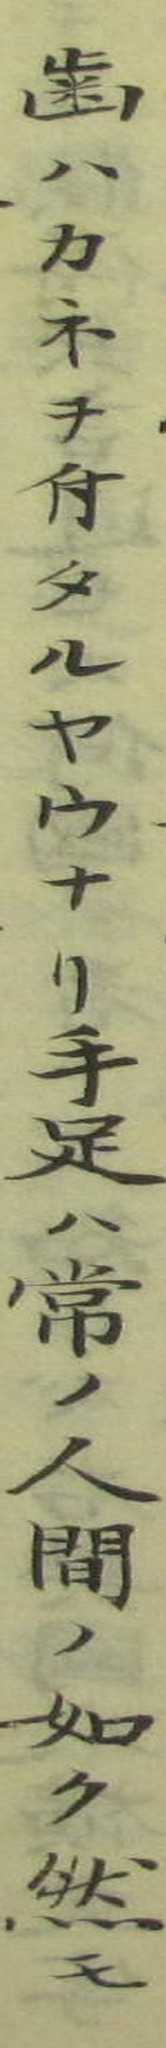歯ハカネチ付タルヤウナリ手足ハ常ノ人間ノ如ク然モ
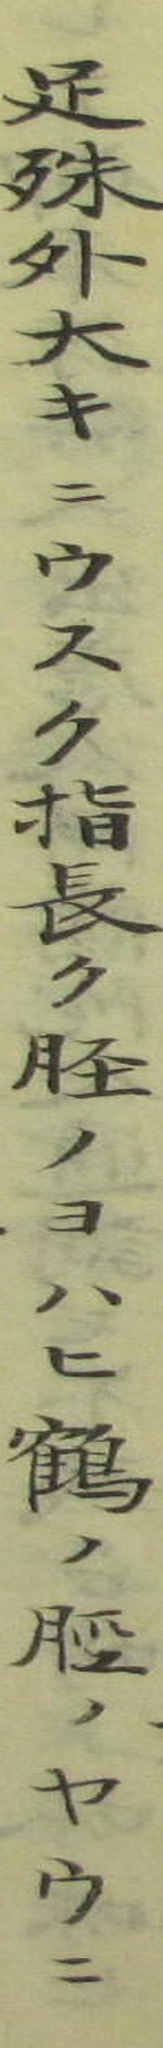足殊外大キニウスク指長ク胚ノヨハヒ鶴ノ脛ノヤウニ
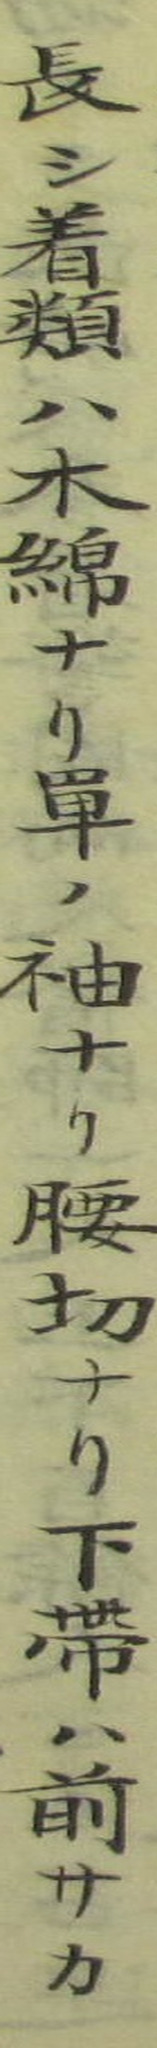長シ着類ハ木綿ナリ單ノ袖ナリ腰切ナリ下帯ハ前サカ
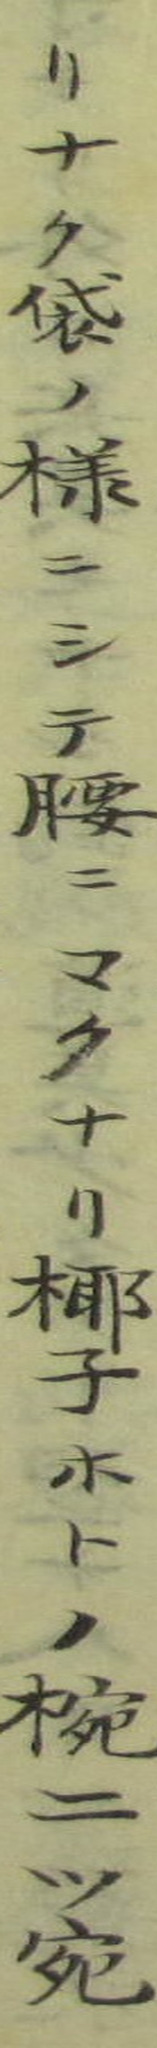リナク袋ノ様ニシテ腰ニマクナリ椰子ホトノ椀二ツ宛
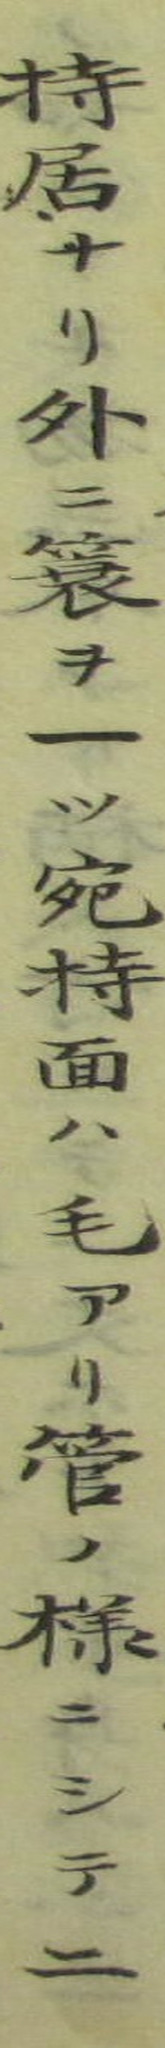持居ナリ外ニ蓑ヲ一ツ宛持面ハ毛アリ管ノ様ニシテ二
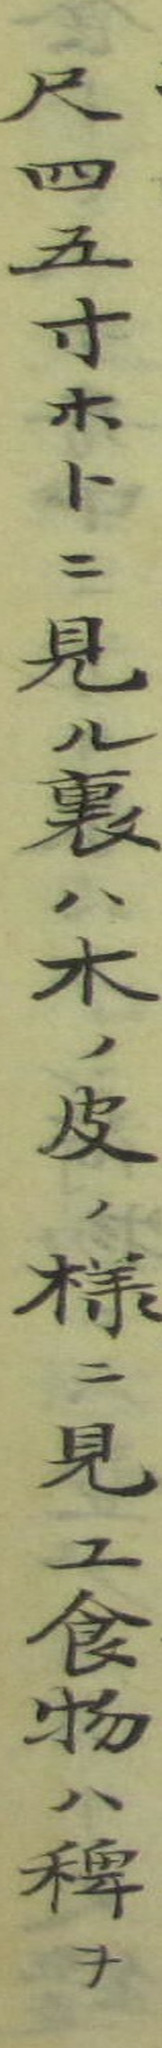尺四五寸ホトニ見ㇽ裏ハ木ノ皮ノ様ニ見ユ食物ハ稗ヲ

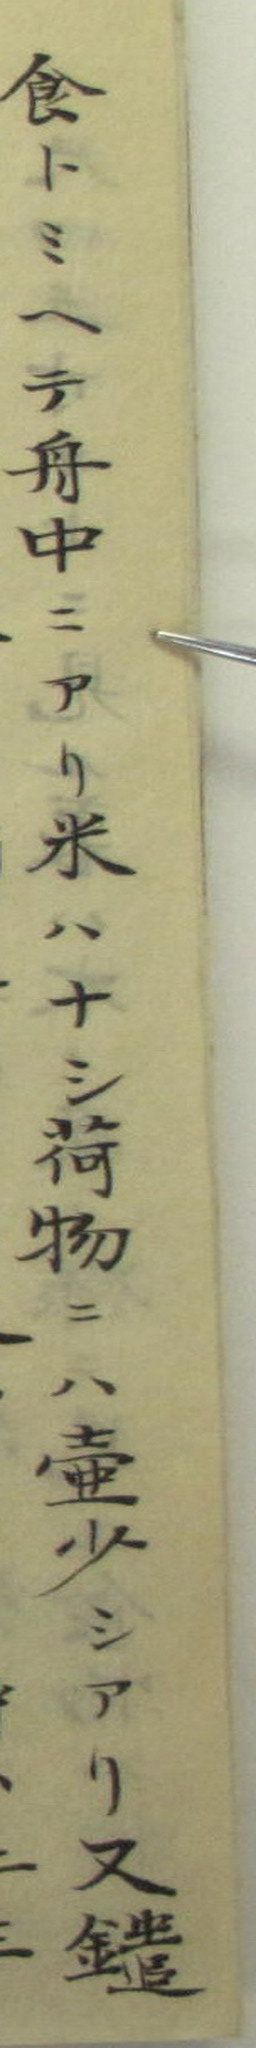食トミヘテ舟中ニアリ米ハナシ荷物ニハ壺少シアリ又鑓
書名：異国船漂着記 外二
